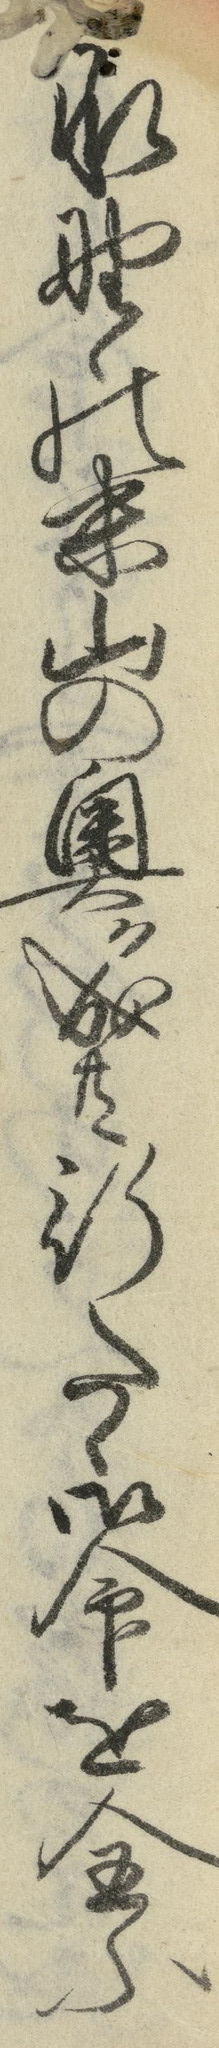承野ゝの末山の奥成共行たゝ御命を全ふ
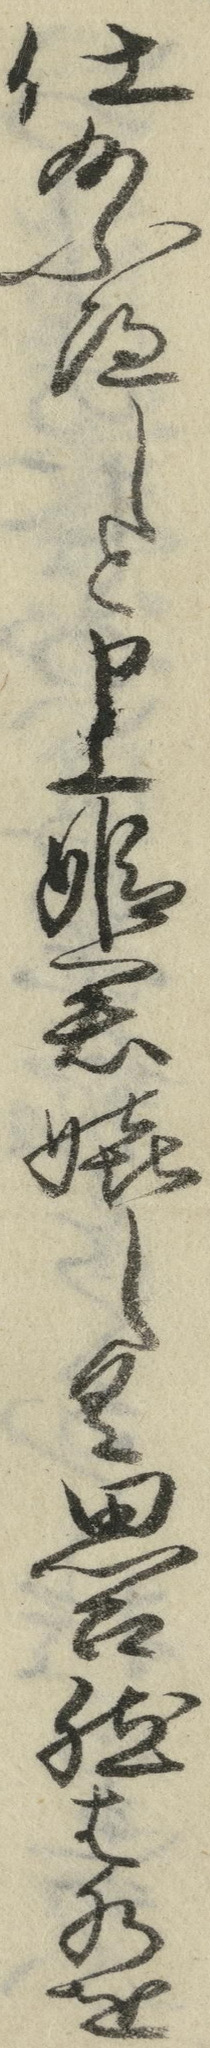仕給ふへしと申上姫君嬉しく思召然は水を
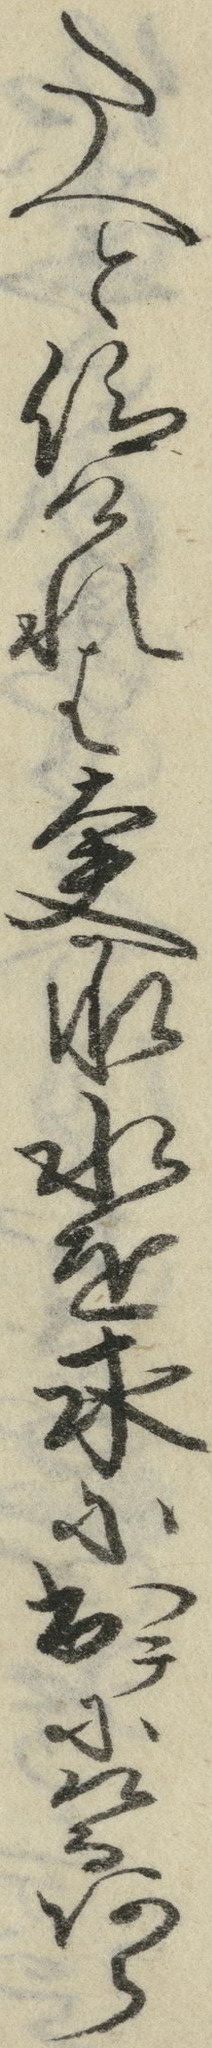たへと仰けれは太夫承水を求に出
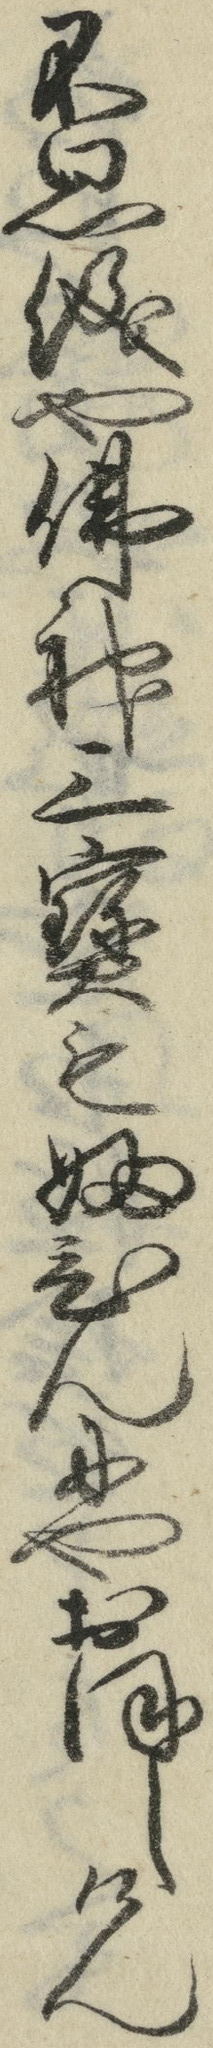不思議や仏神三寶もふひんにやおほしけん
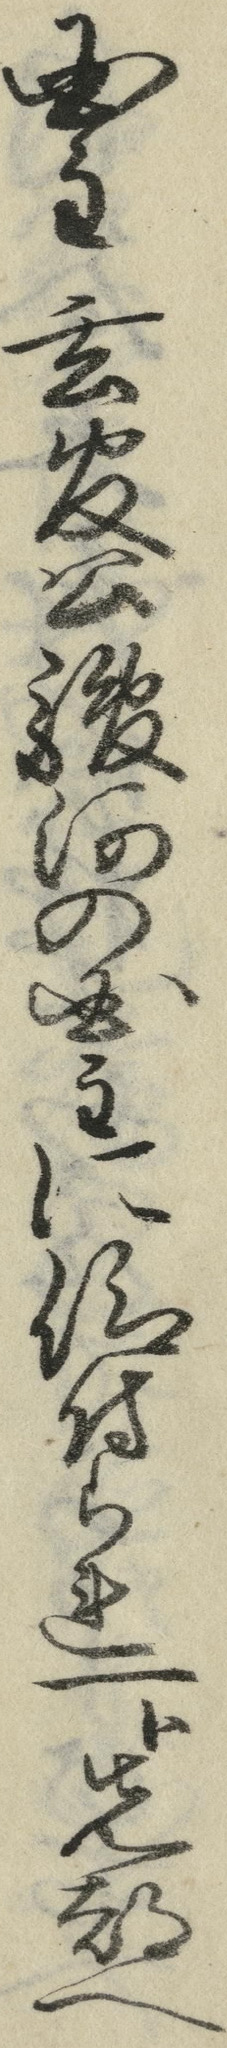国主玄官公駿河の国主に仰付られ一先都へ
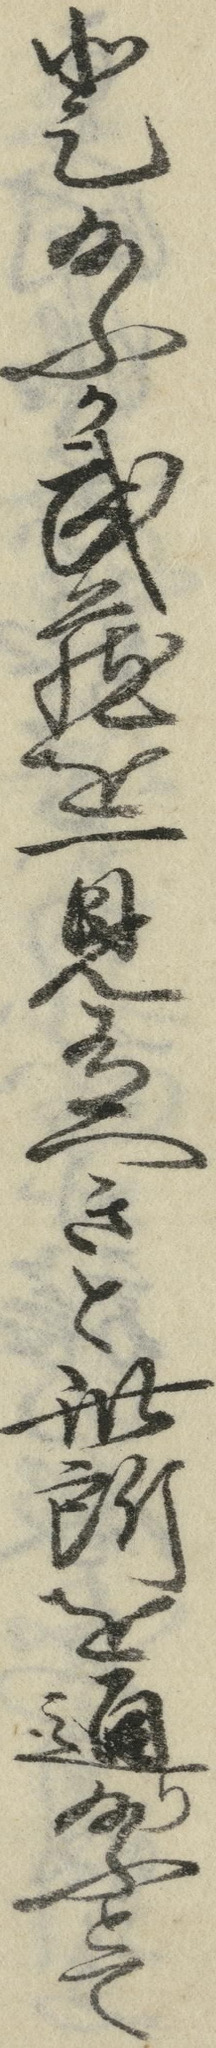登給ふか武蔵を一見有へきと此所を通リ給ふとて
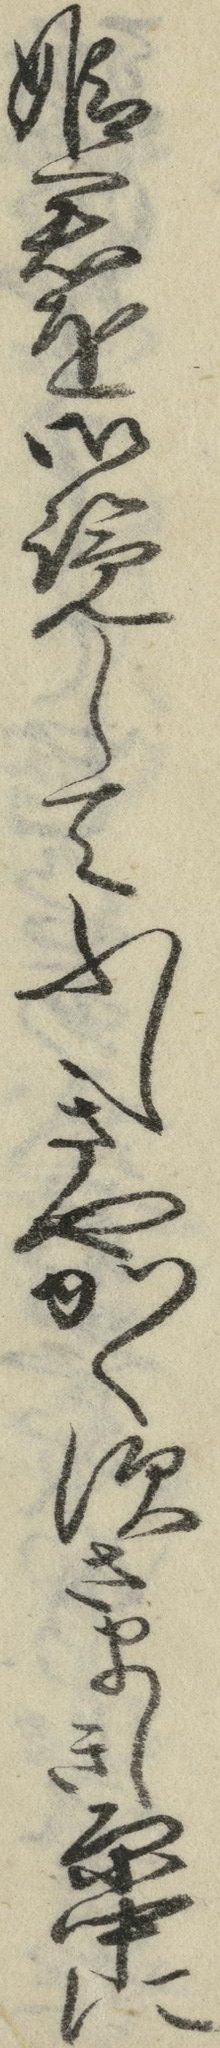姫君を御覧してふしきやかくすさましき原中に
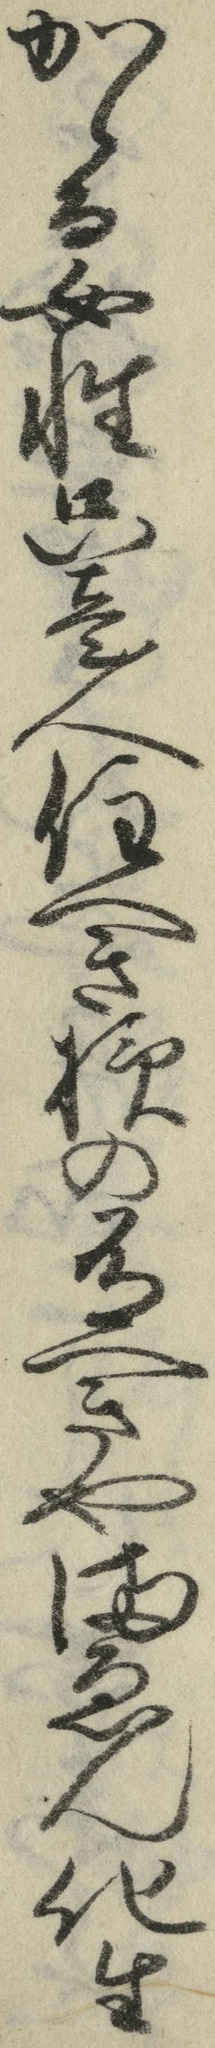かゝる女性只壱人住へき様の有へきやまゑん化生
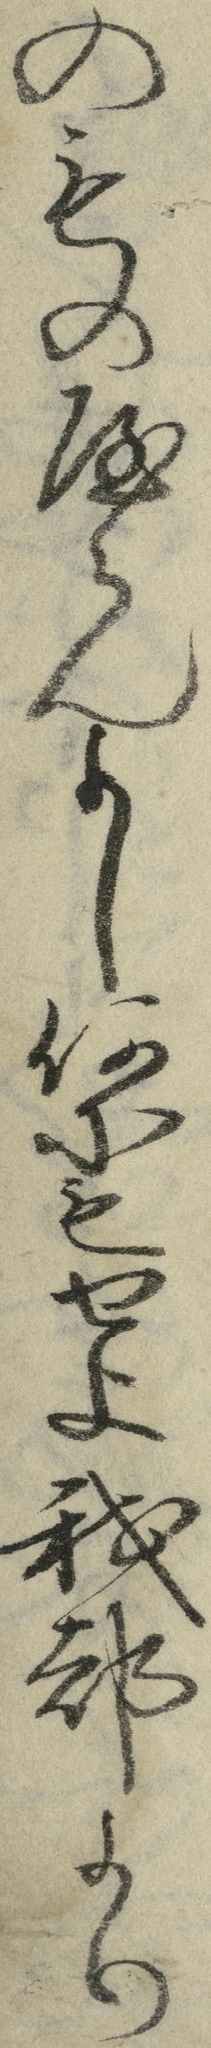のものやらんよし何にもせよ我都より

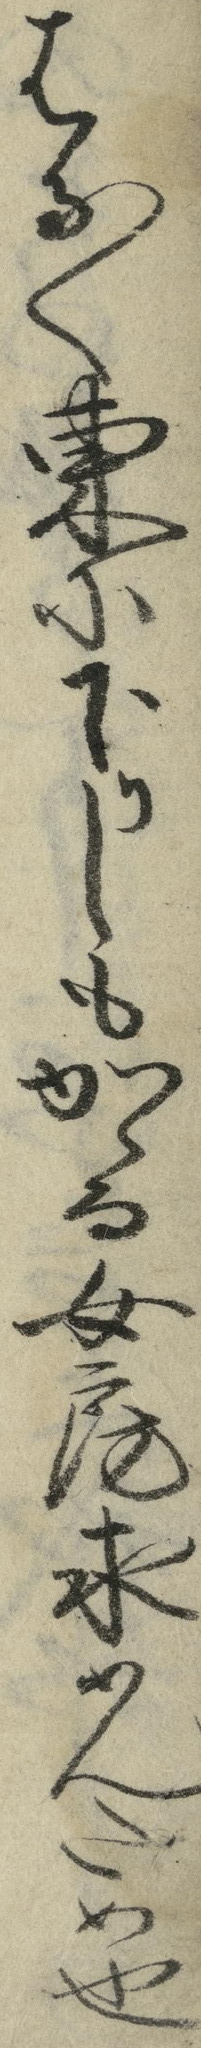はる〳〵東に下ゝる女房求めんため也
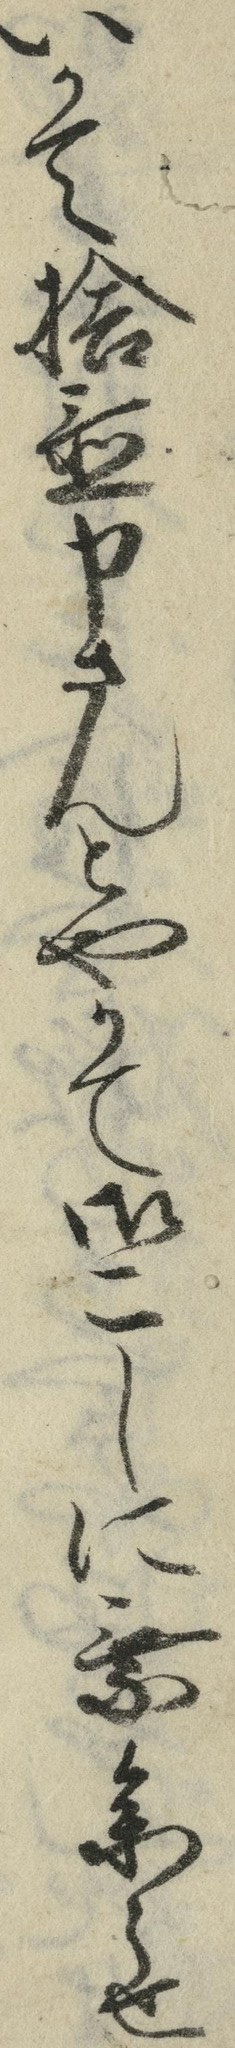いかて捨置申さんとやかて御こしに乗参らせ
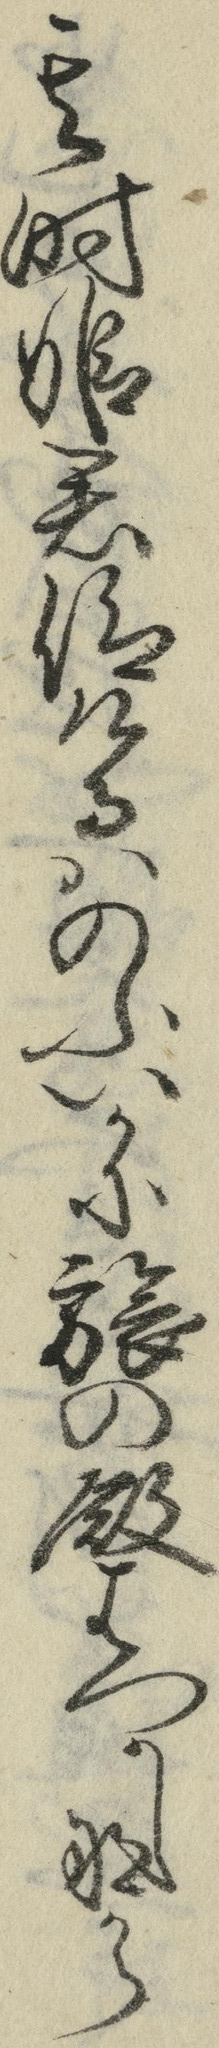其時姫君仰けるはのふいかに旅の殿はつかしなから
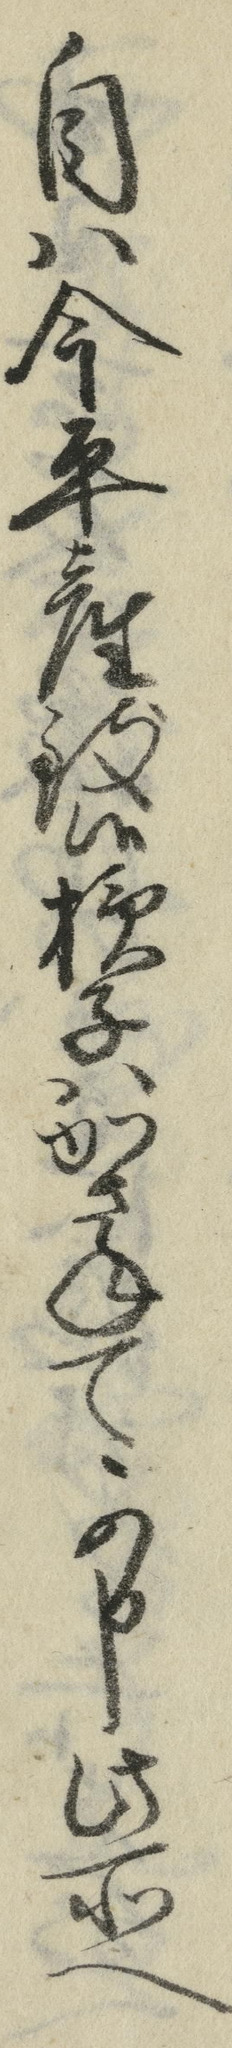自は今平産致候様子はかさねて可申此所へ
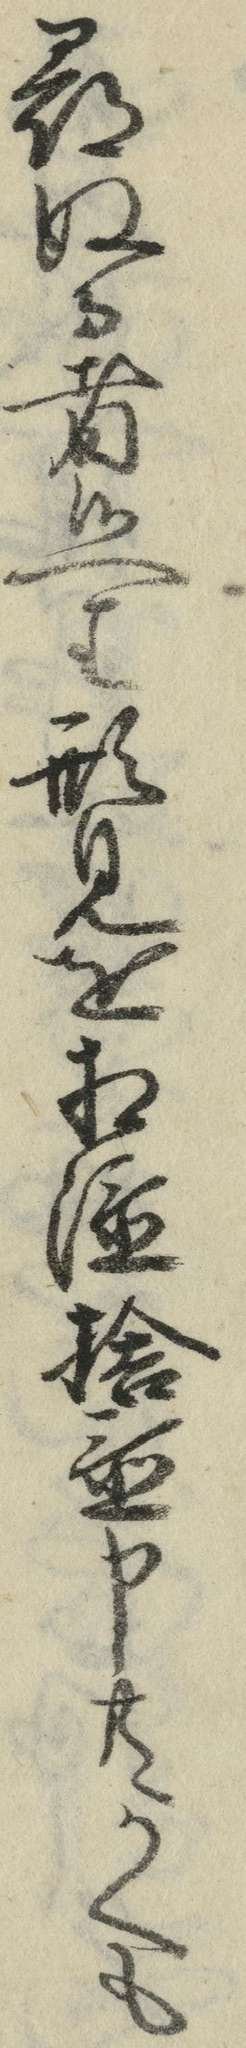尋ぬる者候へは形見を相添捨置申共かくも
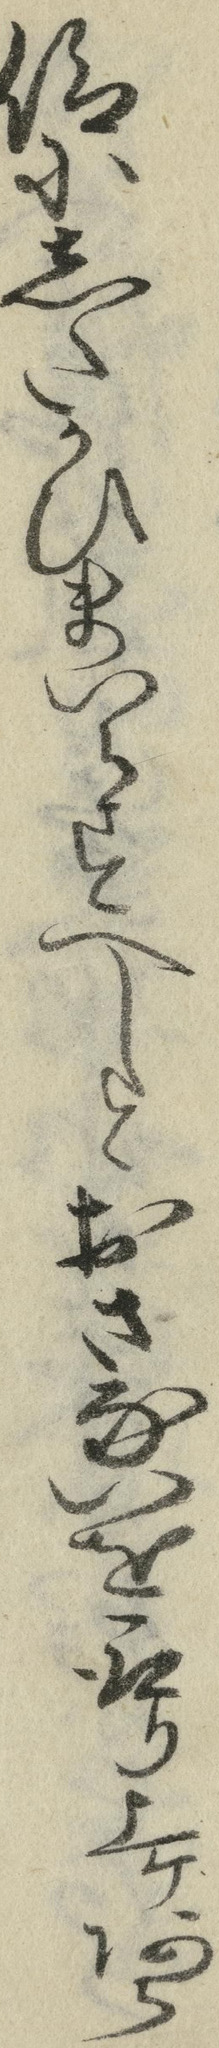仰にしたかひまいらすへしとおさないを取上
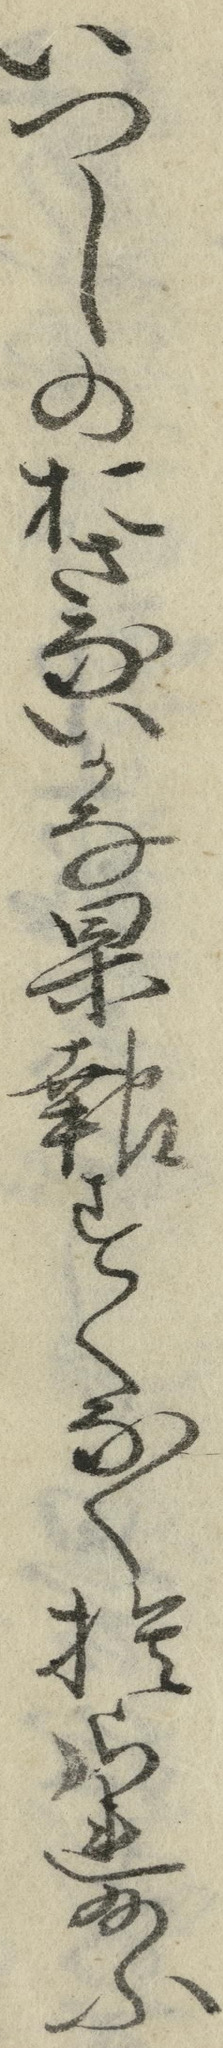いつしのおさないかな果報すくなく捨られ給ふ
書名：浅間記
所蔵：東京大学地震研究所図書室 Earthquake Research Institute Library, The University of Tokyo, JAPAN
